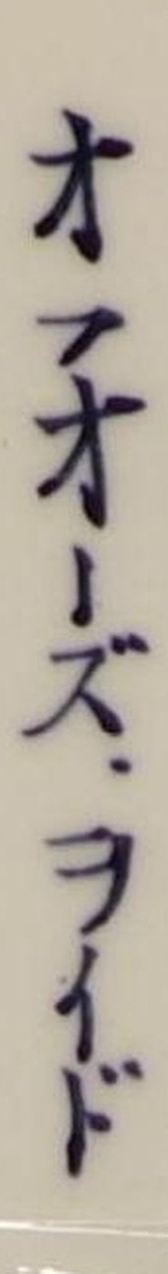オフオーズヲイド
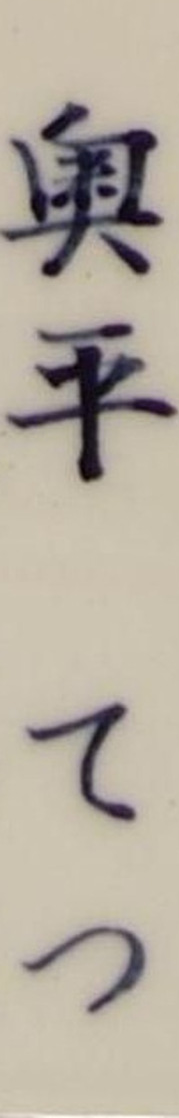奥平てつ
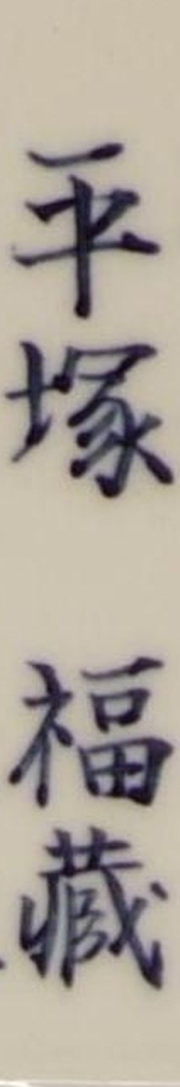平塚福蔵
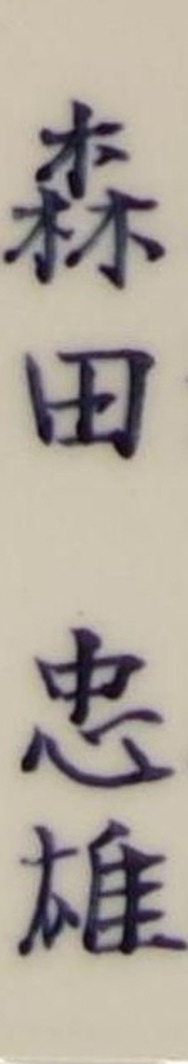森田忠雄
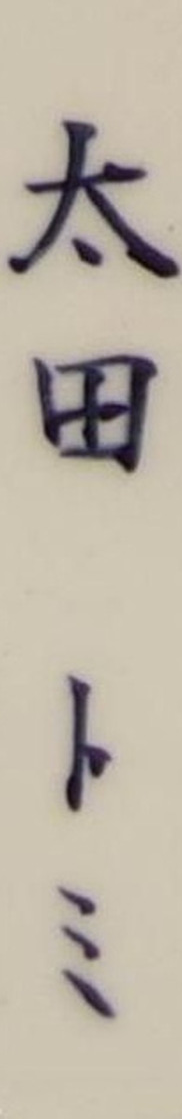太田トミ
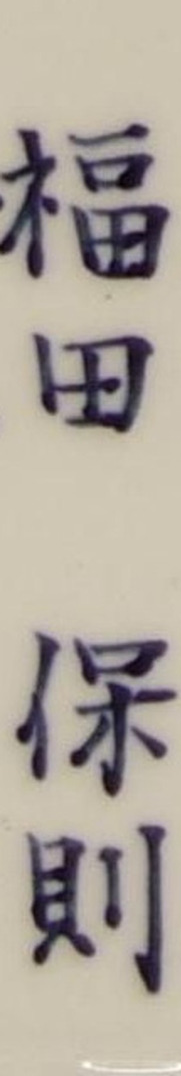福田保則
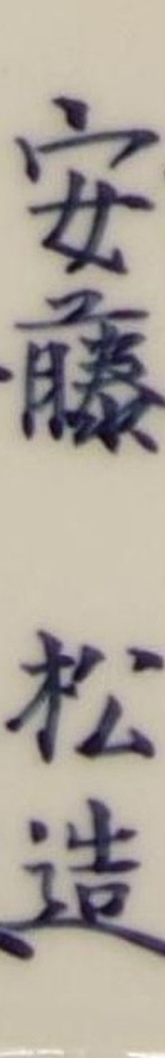安藤松造
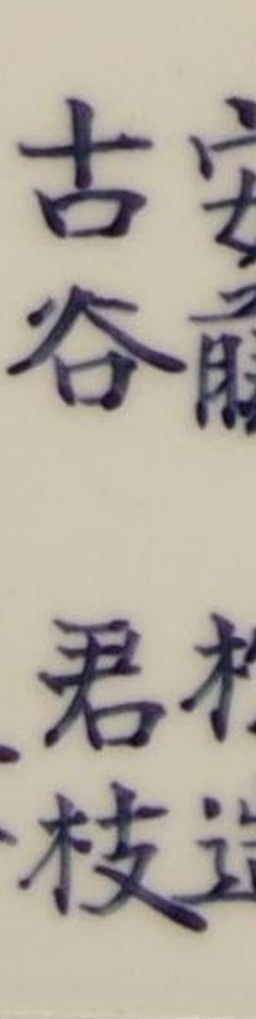古谷君枝

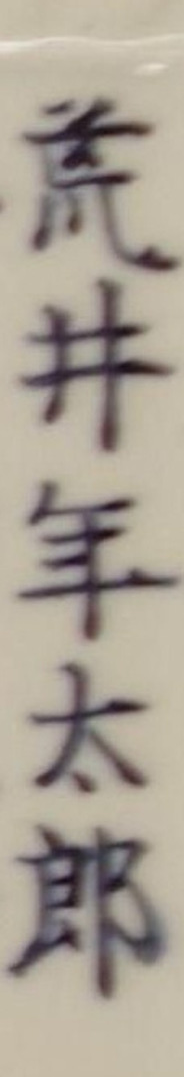荒井年太郎
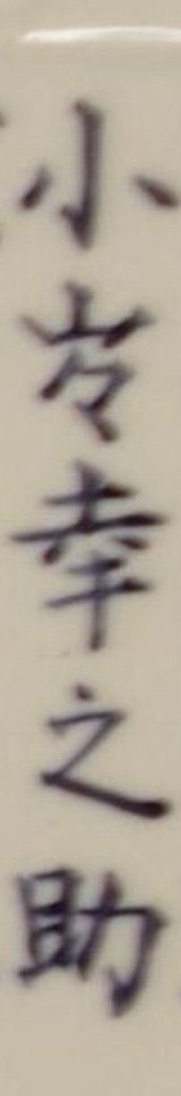小㞮幸之助
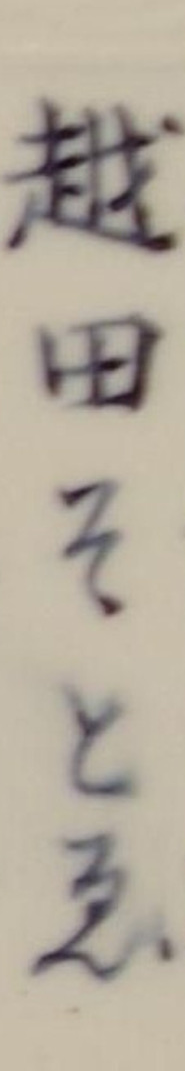越田そとゑ
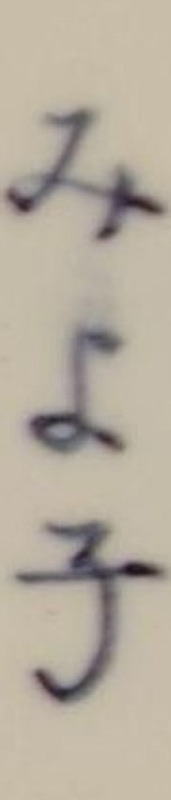みよ子
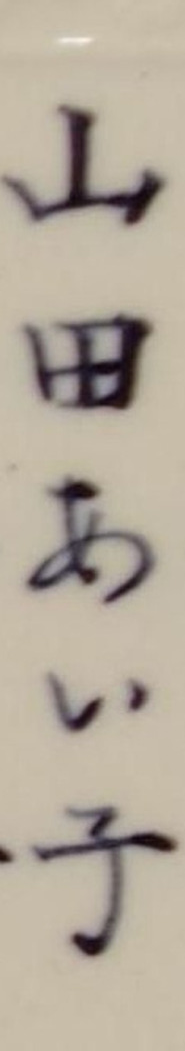山田あい子
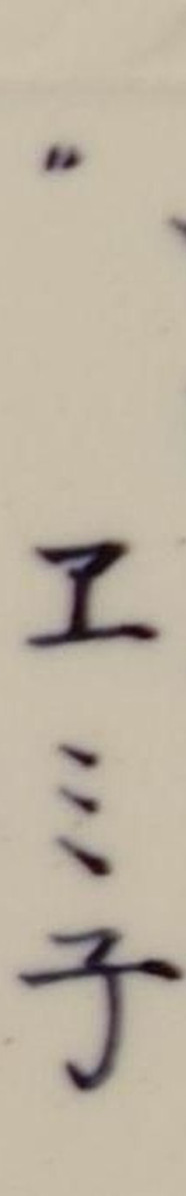エミ子
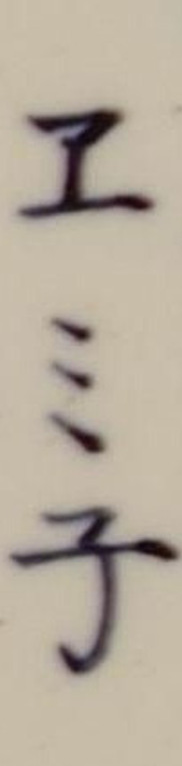エミ子
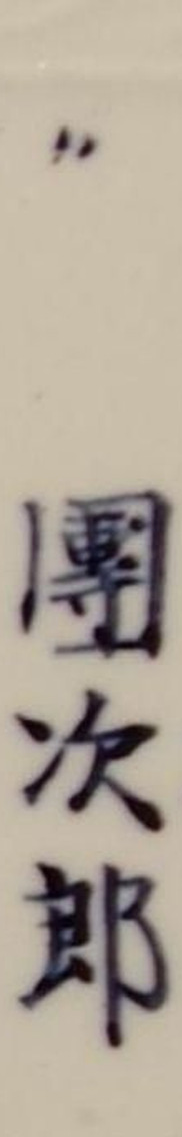團次郎
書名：M~S
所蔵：高野山金剛峯寺
